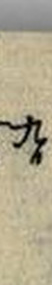廿九日
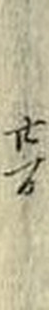廿九日
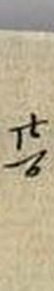廿九日
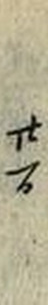廿九日
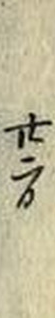廿九日
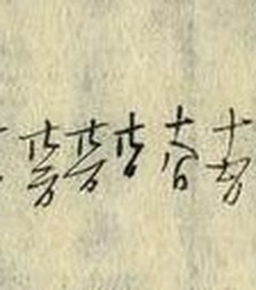廿九日
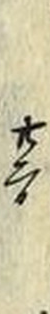廿九日
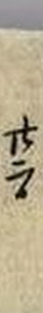廿九日
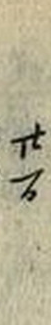廿九日
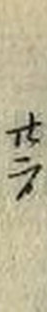廿九日
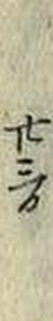廿九日
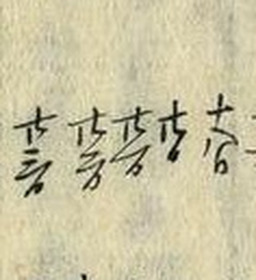廿九日
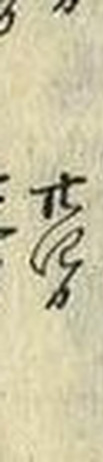廿九日
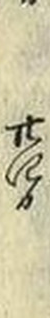廿九日
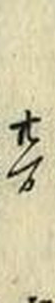廿九日
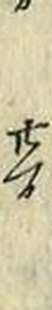廿九日
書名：少傅日録抄（斉承付側向頭取日記、在国）
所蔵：福井県文書館 Fukui Prefectural Archives
